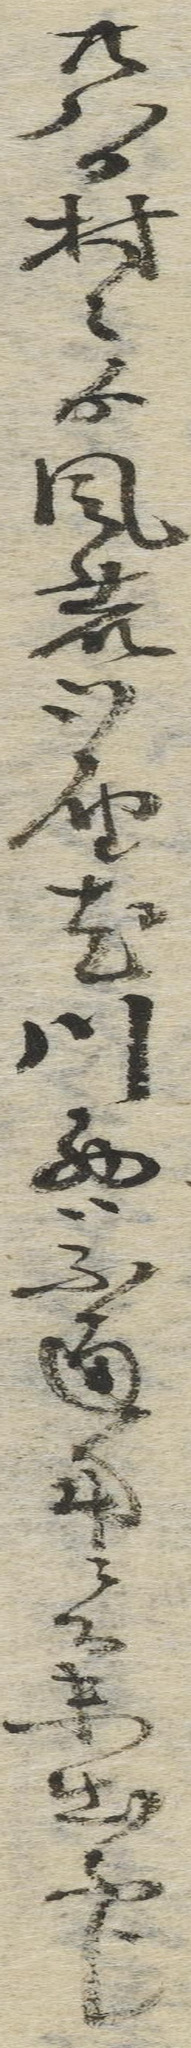廿八日村々ゟ風荒御届尤川西ハ不通用二而未出申候
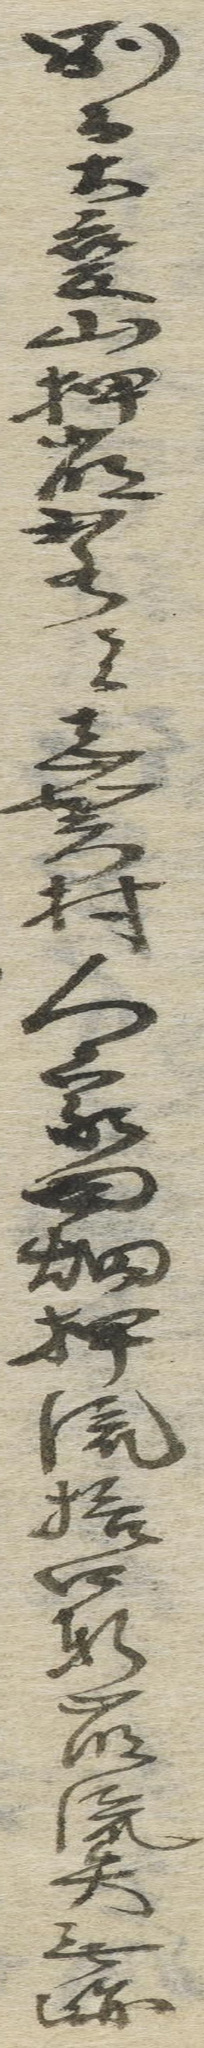別而大変山押崩出水二而志賀村人家田畑押流し拾四軒崩流失無跡
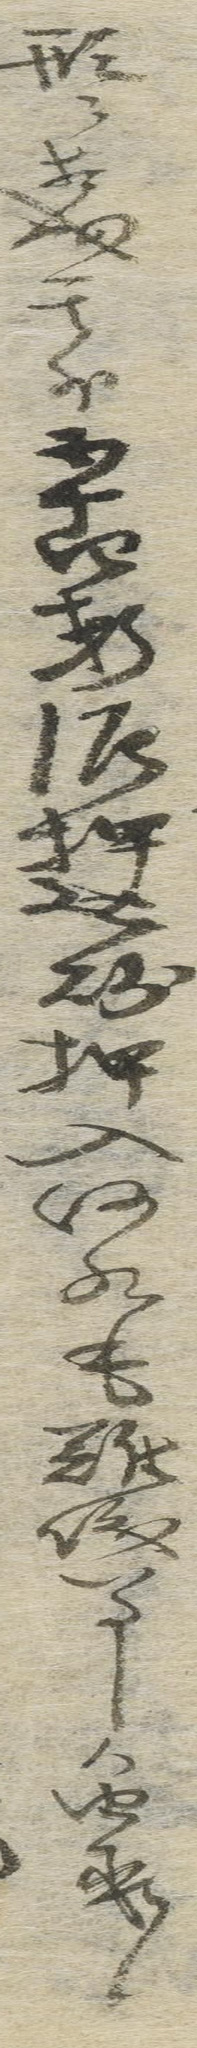形二相成其外五十四軒泥押込砂押入何れも難儀いたし候由承候
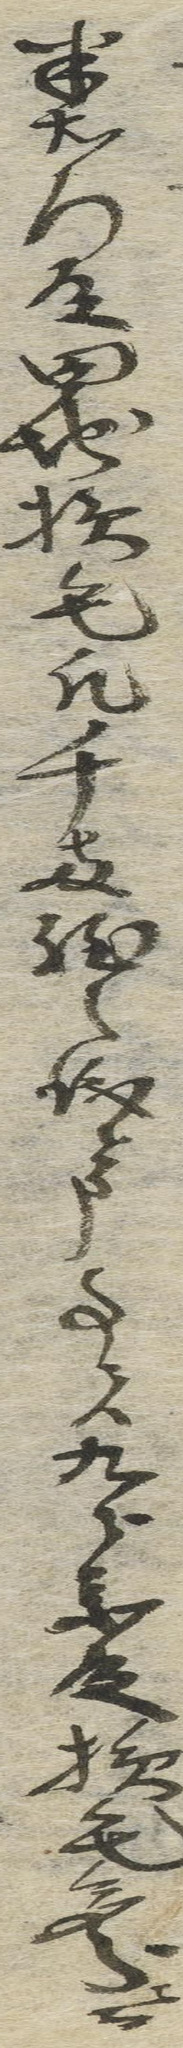半右衛門殿田地損毛凡千両程之儀と申事二候九郎兵衛殿損毛多分二而
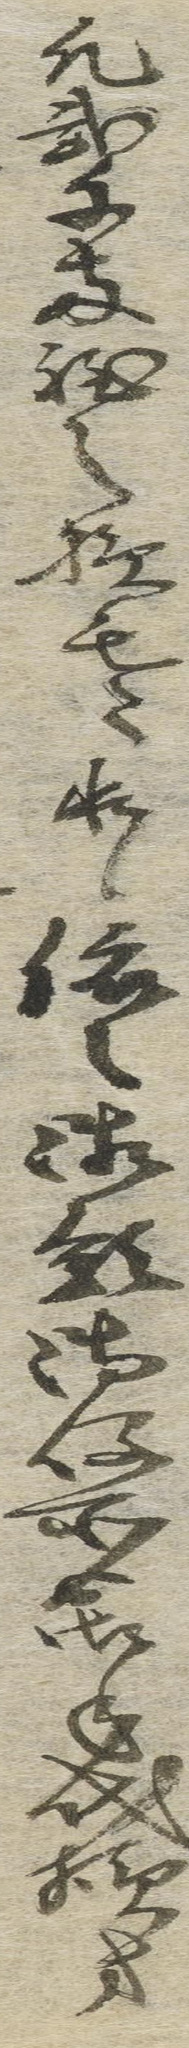凡弐千両程之損毛二承候依之御領御役所ゟ御手代様方
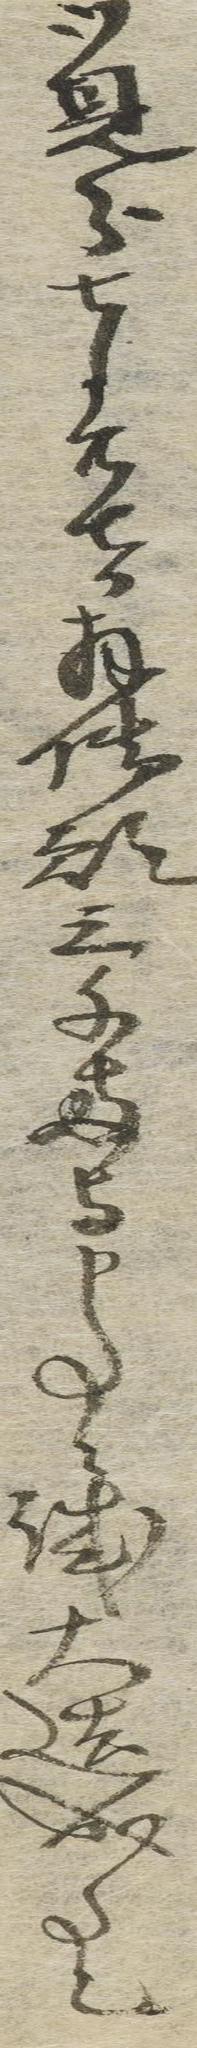御見分七月廿七日拝借願三千両と申事二誠大造成事二候
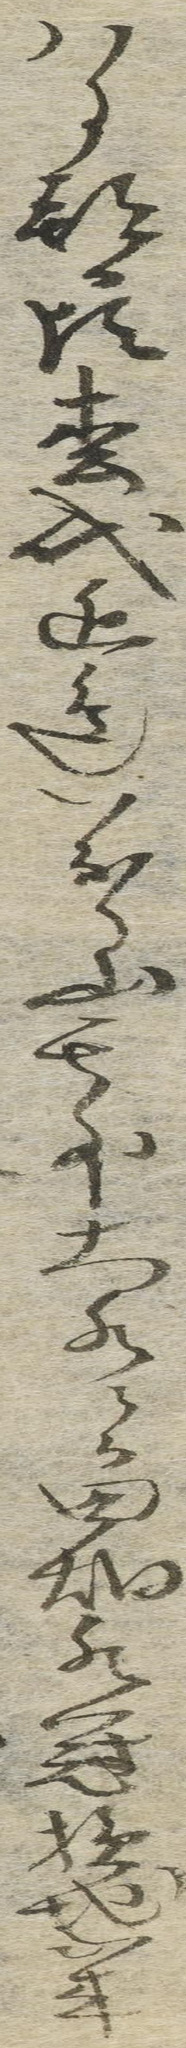八月朔日頃枩代近辺いなり山其外大水二而田畑水冠損地出来
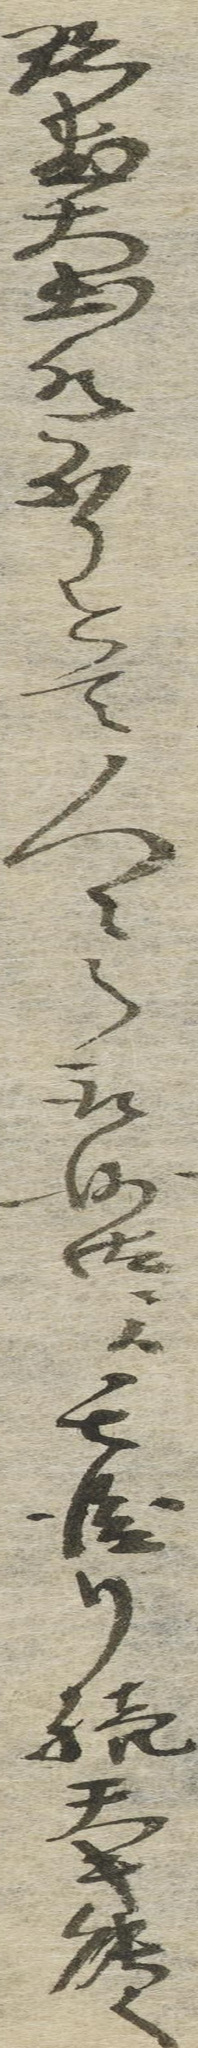珍敷大出水なりとて人々之取沙汰二候其後引続天キ能く
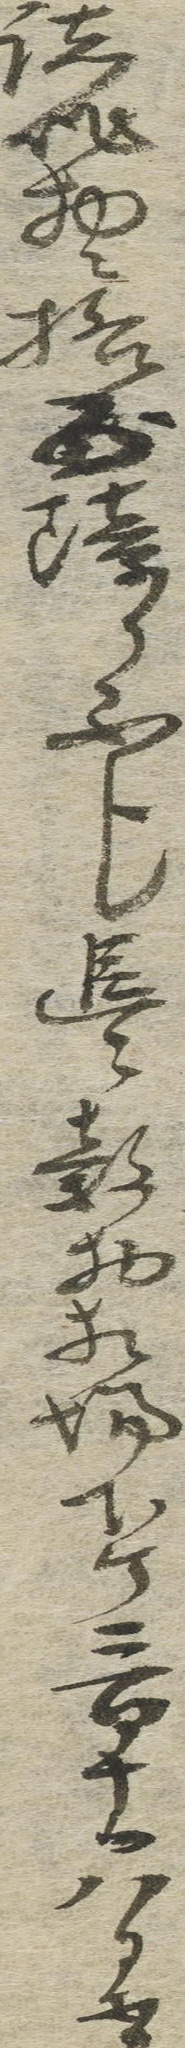諸作物二格別障り不申候追々穀物相場下ヶ二百十日八月五日
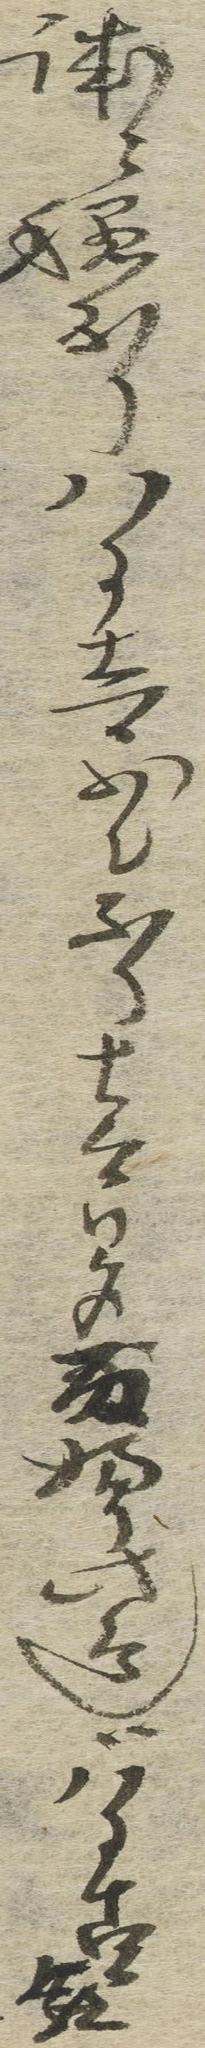誠二穏なり八月十二日少しふり十三日夕雨ふり此辺ハ月十四日朝ゟ

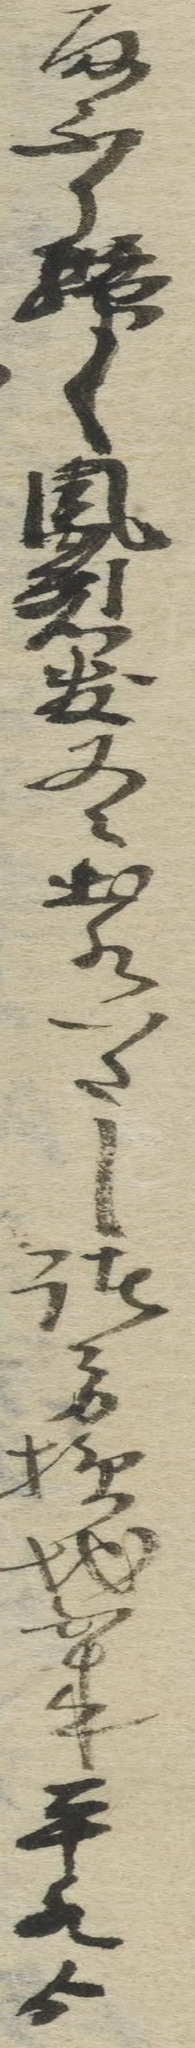雨ふり続く風烈敷又々出水いたし諸方損地出来平水ゟ
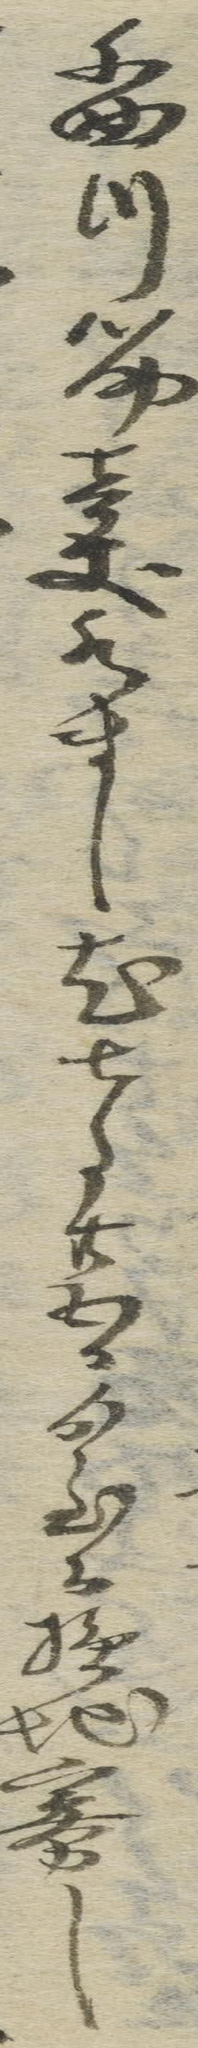千曲川筋差支いたし尤七月廿五日ゟ至而損地し
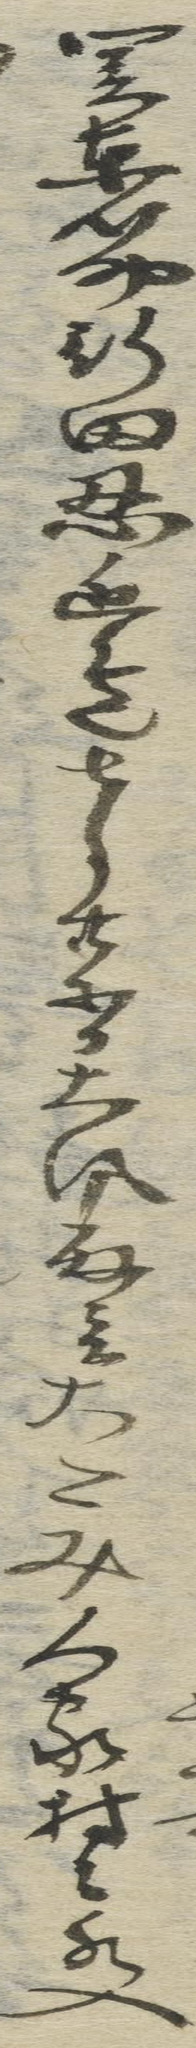関東筋行田忍辺迄七月廿五日大風雨二而大いたみ人家村々水入
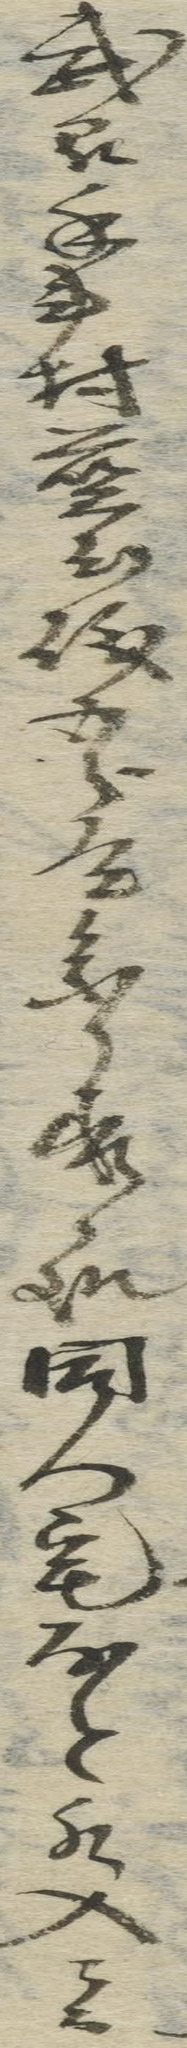武州手斗村筮屋磯五郎殿参り承候処同人宅なと水入二而
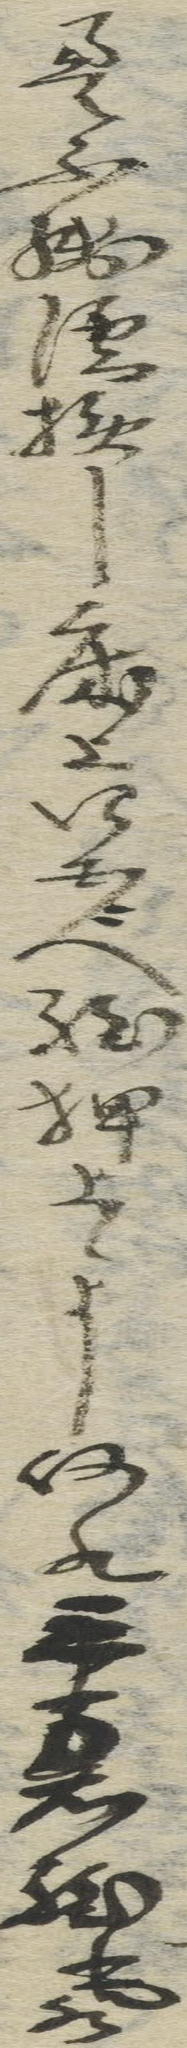畳不残濡損し床上四五尺程押上候よし何れ三万石程も水
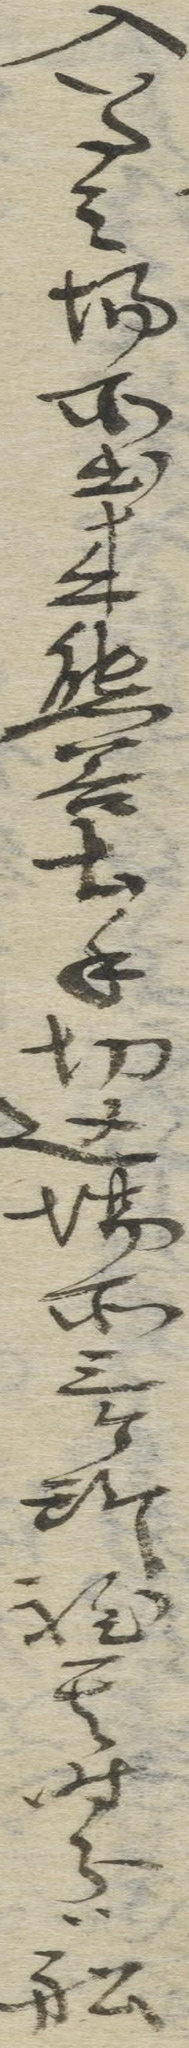入いたミ場所出来熊筈土手切込場所三ヶ所程其時分ハ船
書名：信濃越後　地震書留
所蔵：東京大学地震研究所図書室 Earthquake Research Institute Library, The University of Tokyo, JAPAN
